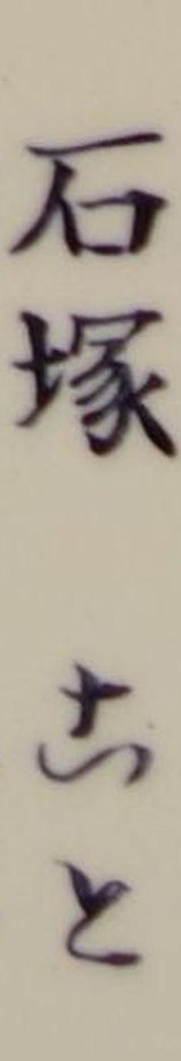石塚こと
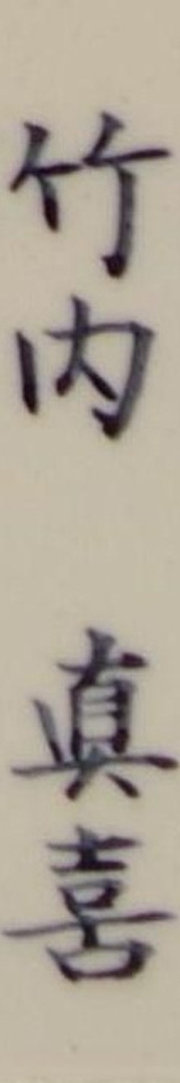竹内真喜
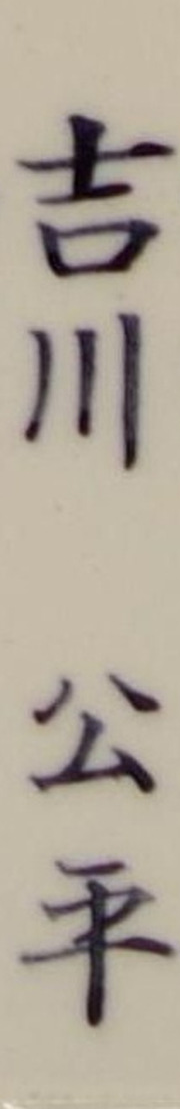吉川公平
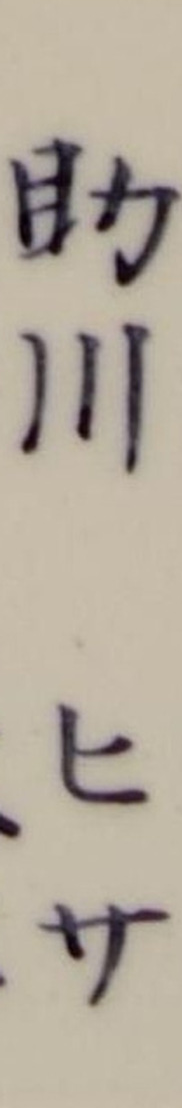助川ヒサ
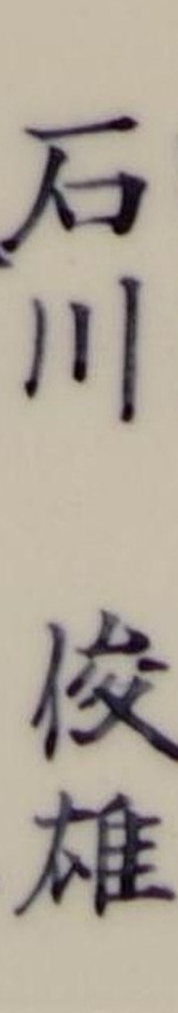石川俊雄
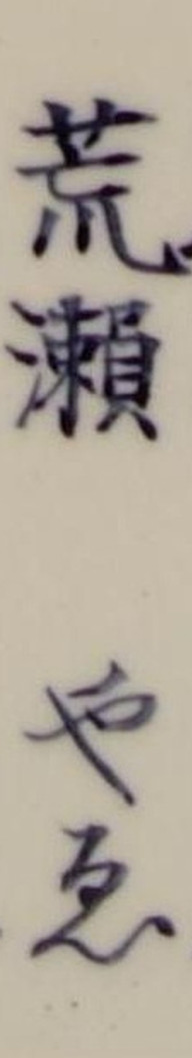荒瀬やゑ
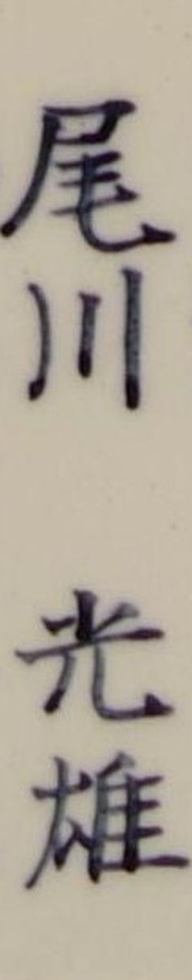尾川光雄
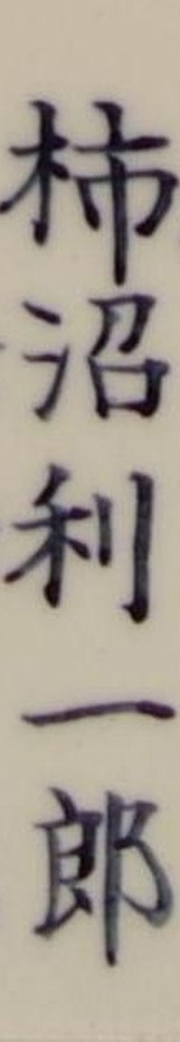柿沼利一郎
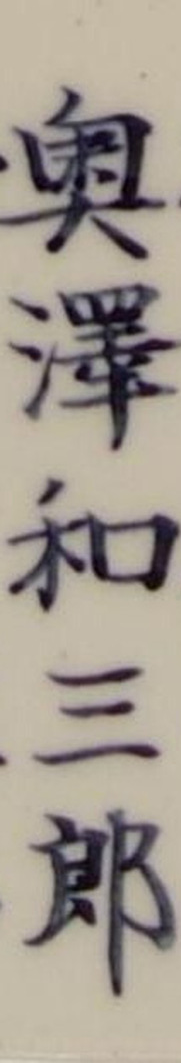奥澤和三郎
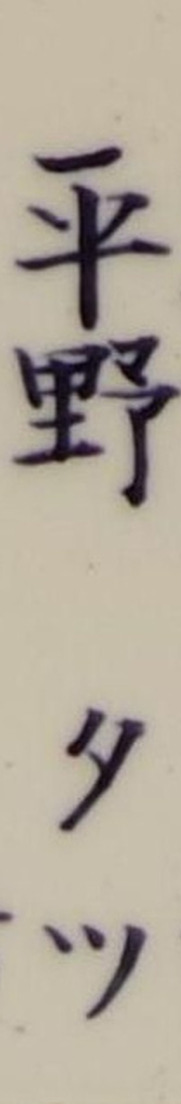平野タツ
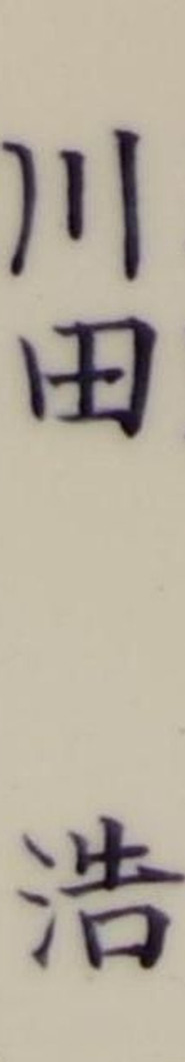川田浩
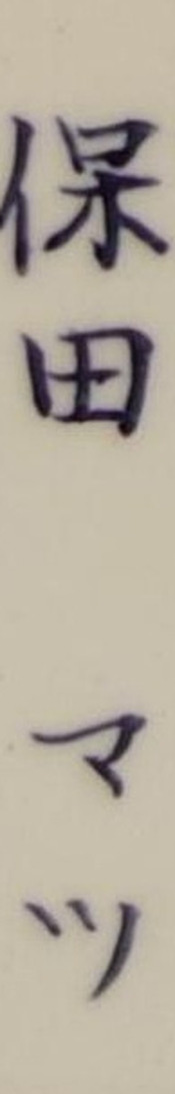保田マツ
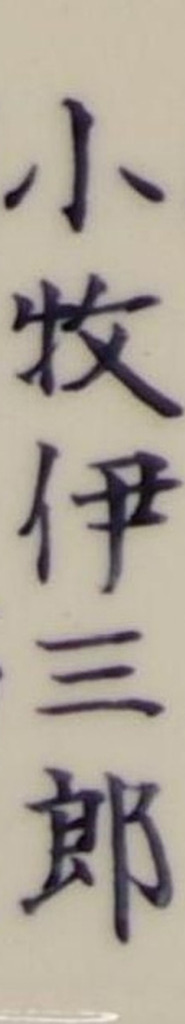小牧伊三郎
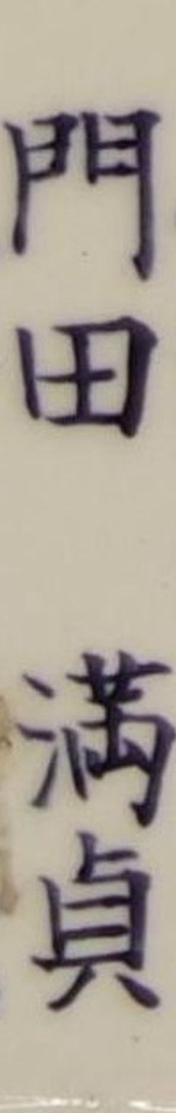門田満貞
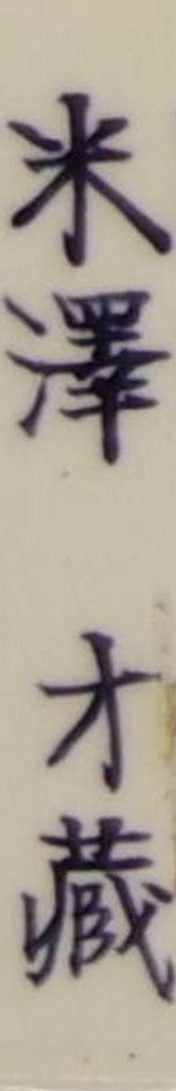米沢才蔵
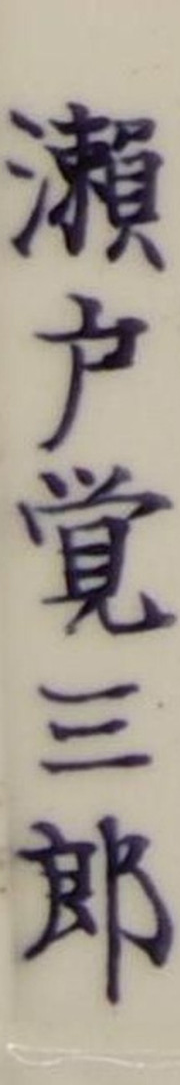瀬戸覚三郎
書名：M~S
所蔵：高野山金剛峯寺
